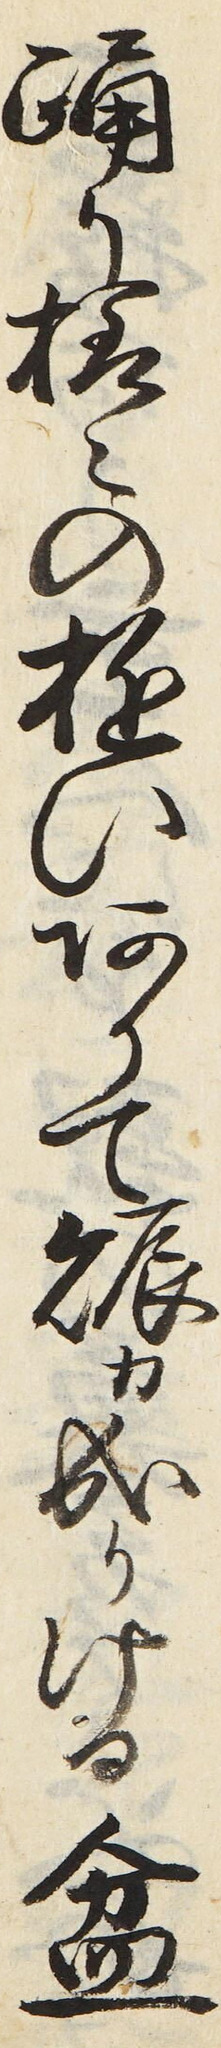踊り様々の遊ひありて賑か成りける盆
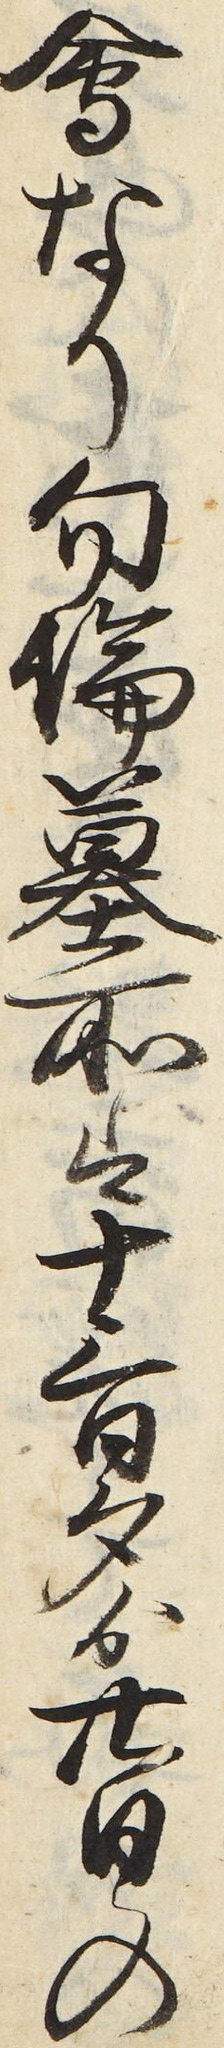会なり勿論墓所は十三日夕ゟ廿日の

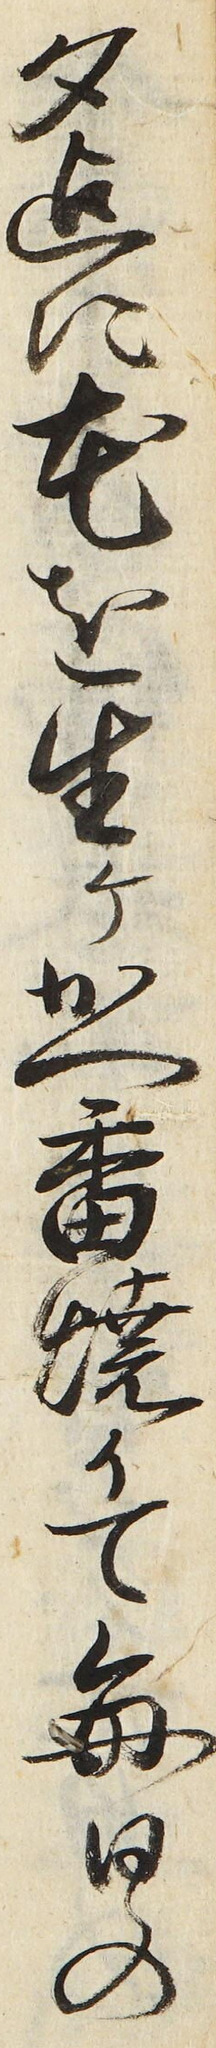夕迠に花を生けかへ香焼りて毎日の
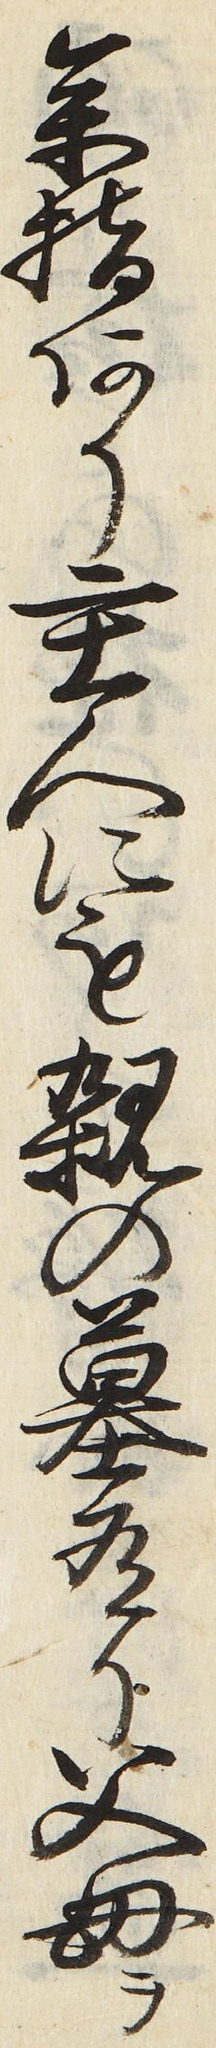参詣あり主人にも親の墓有り父母を
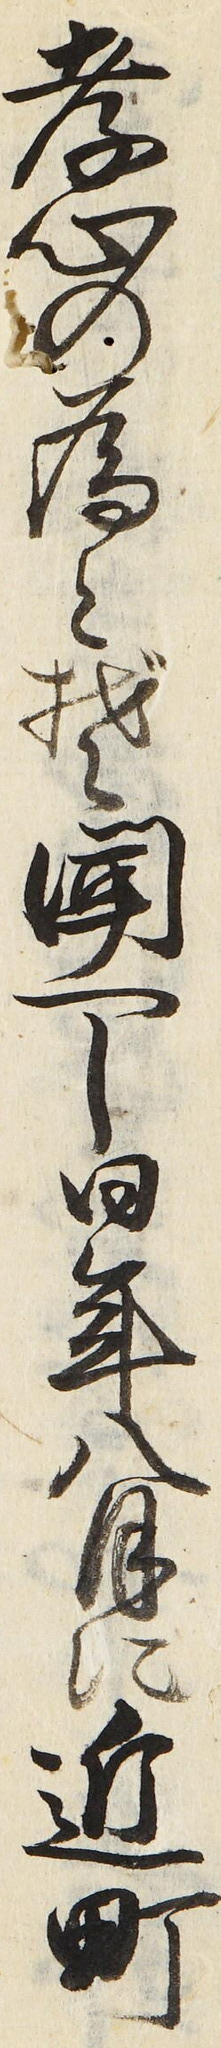孝心の為とぞ聞へし旧年八月に近町
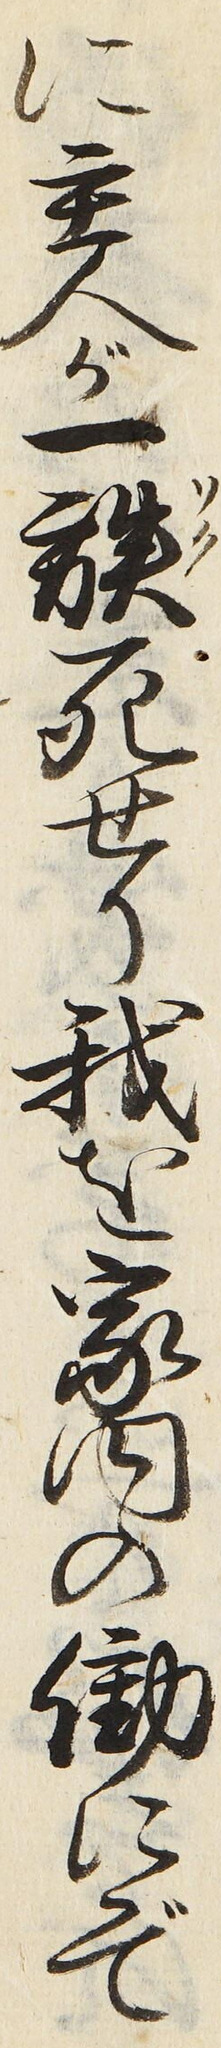に主人が一族死せり我を家内の働にぞ
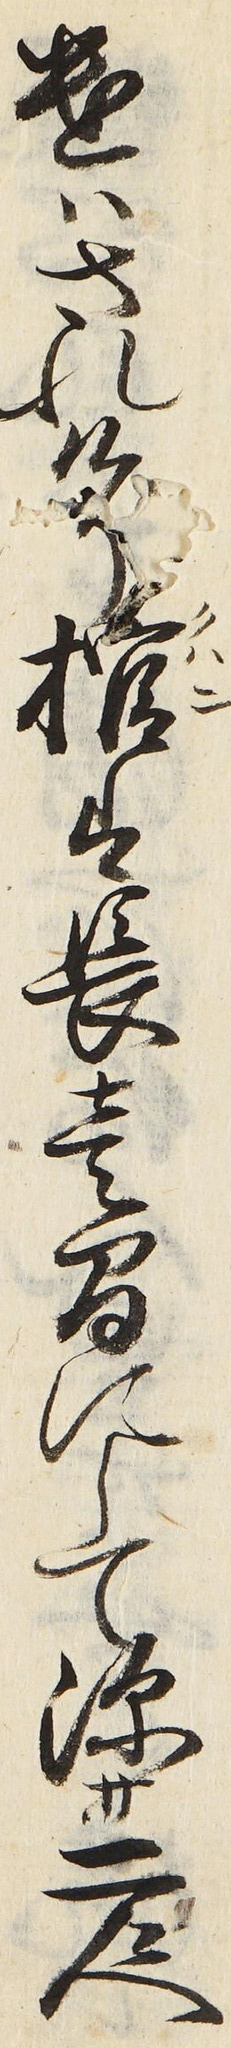遣はされけり棺は長壱間にして深さ二尺
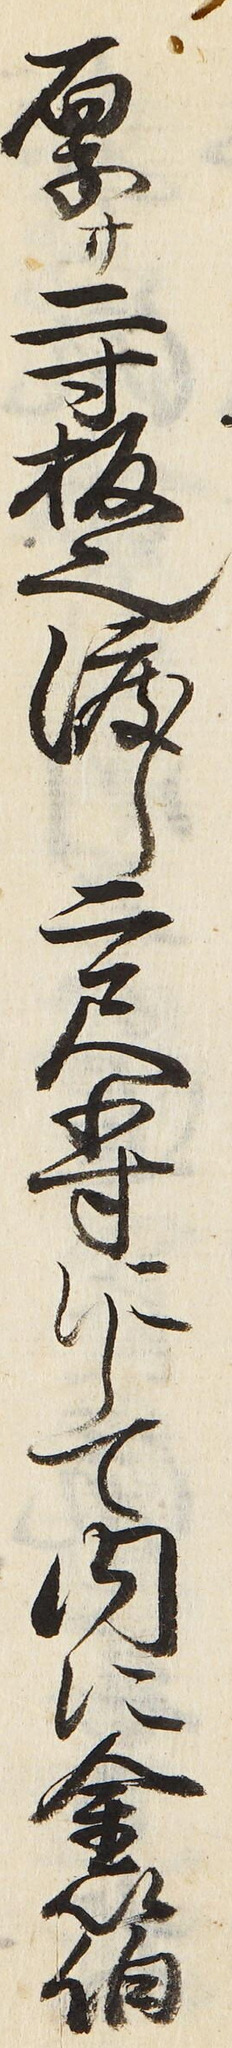厚さ二寸板也渡し二尺五寸にして内に金箔
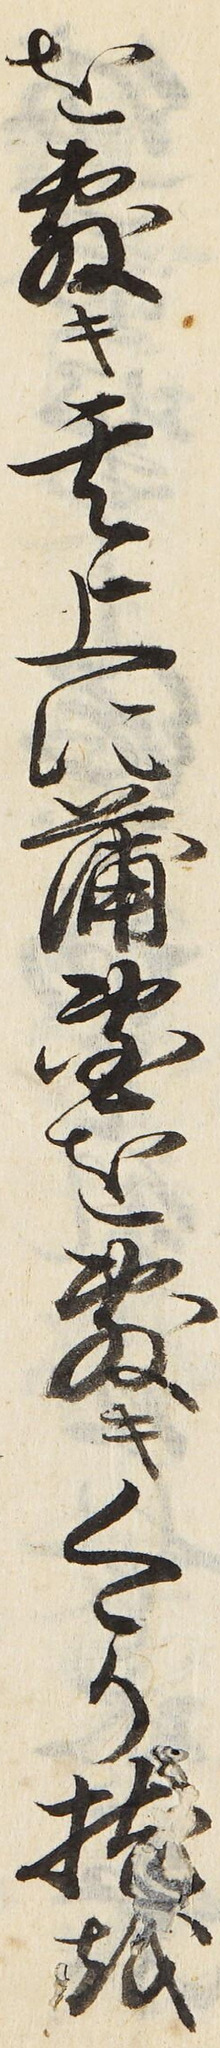を敷き其上に蒲団を敷きくゝり枕を
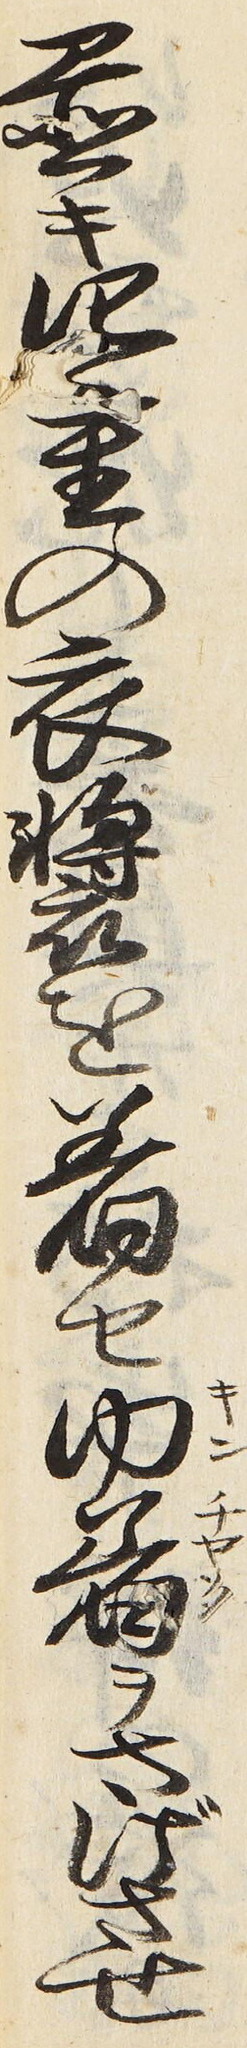置き四重の衣装を着せ巾着をさげさせ
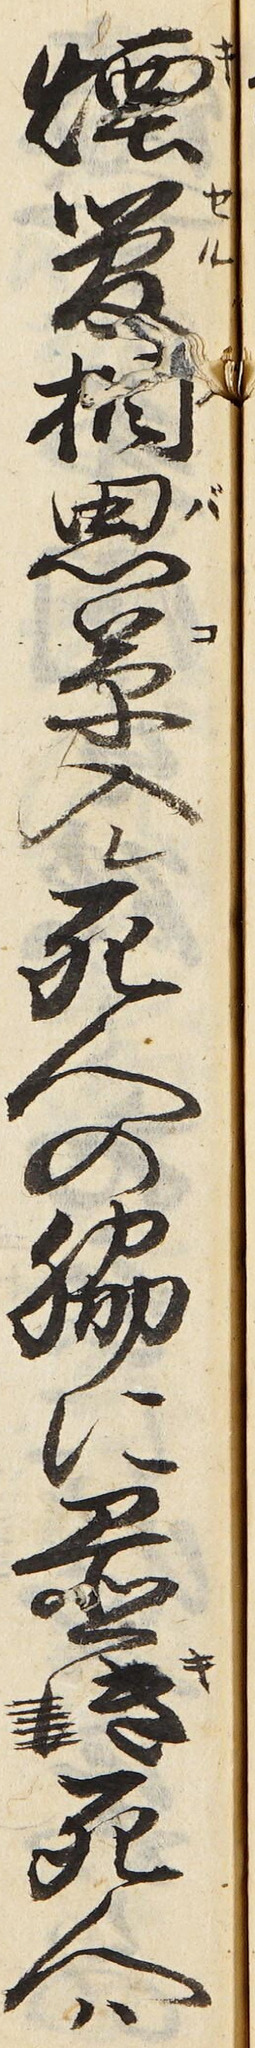煙管相思草入れ死人の脇に置き死人は
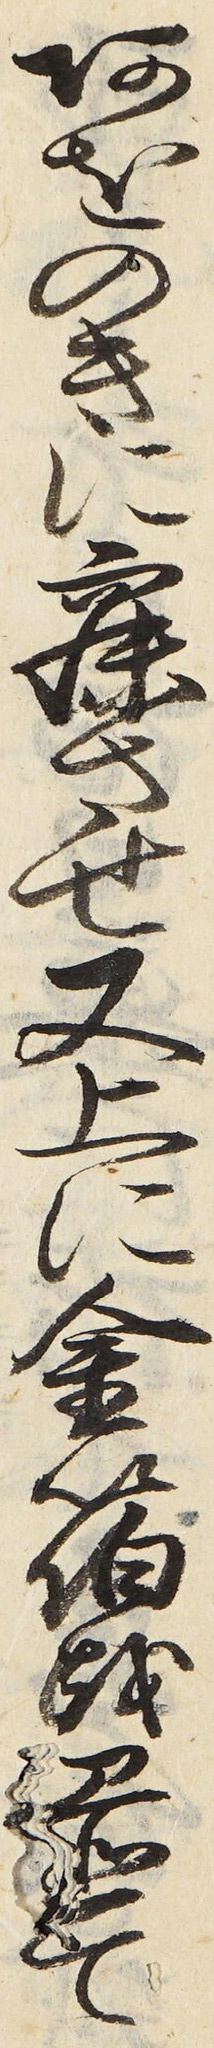あをのきに寝させ又上に金箔を置て
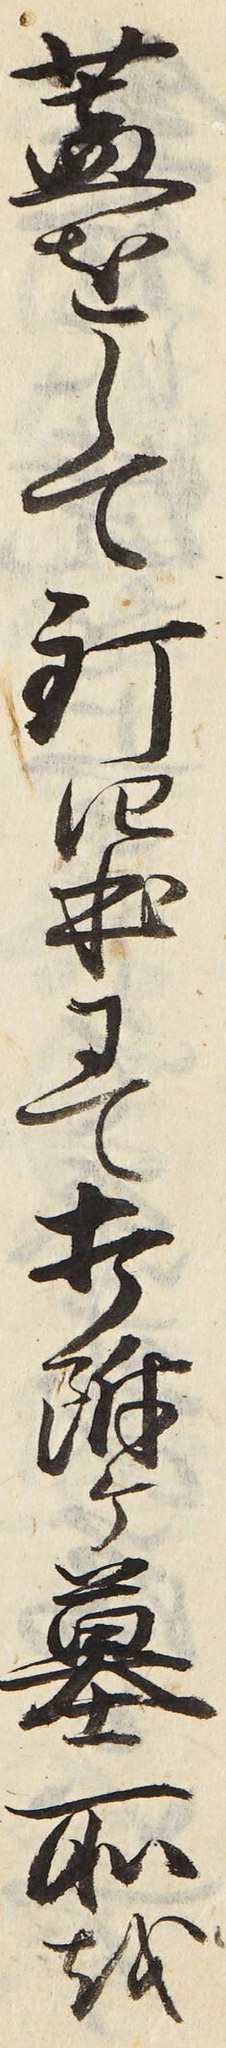蓋をして釘四本にて打附け墓所を
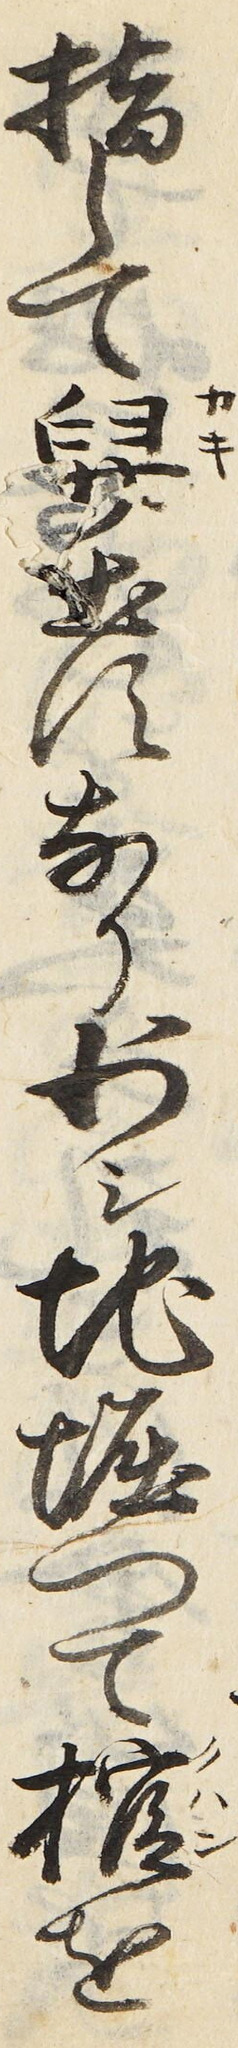指して舁出すなり少し地掘つて棺を
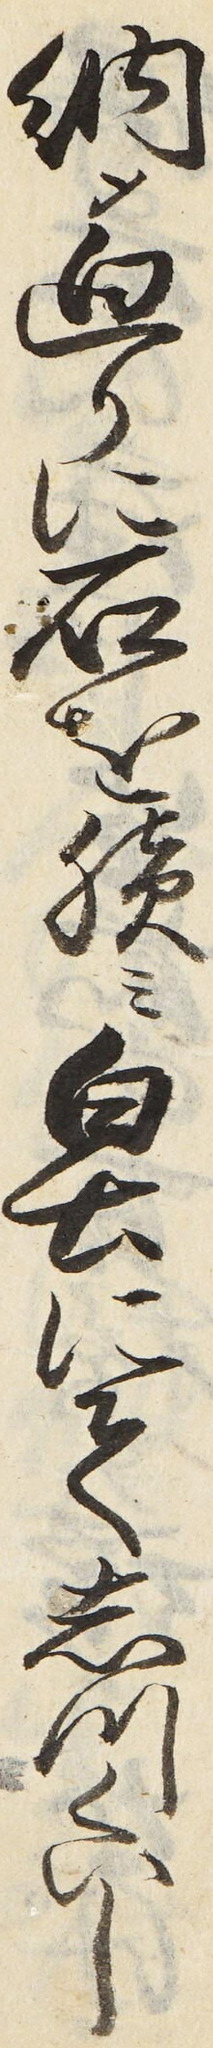納め廻りに石を積み白土にてしつくいし
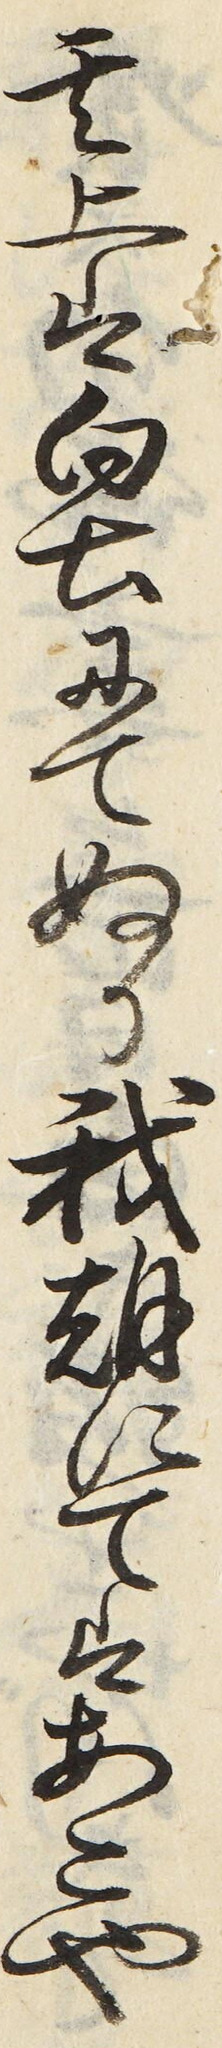其上は白土にてぬり我朝にてはあこや
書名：華夷九年録
